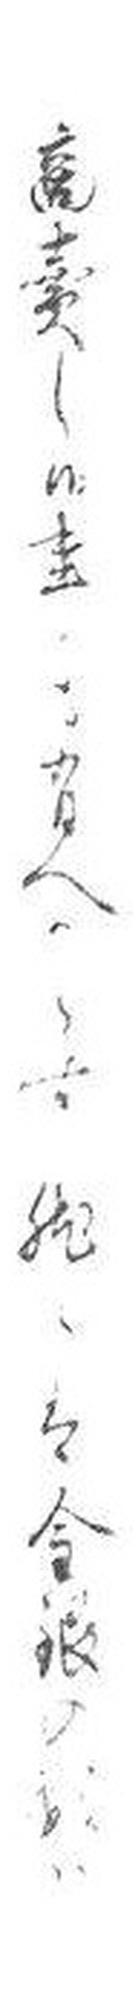商売し候事も有へからす然らは金銀の類ハ
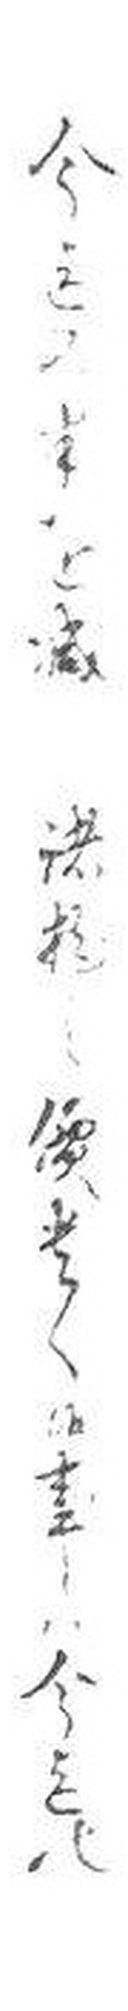今迄の事を減諸物の價貴く候事ハ今迄の
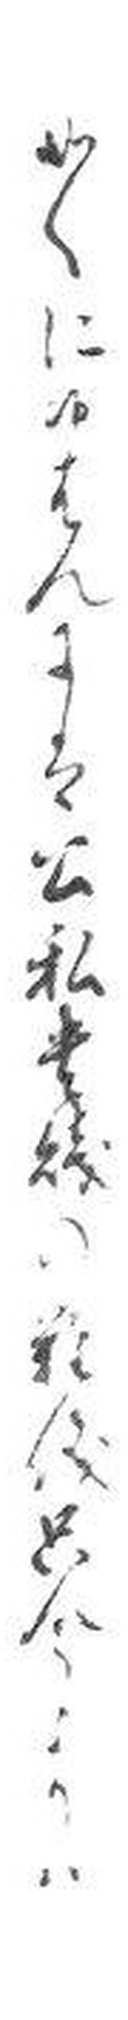如くに候はんには公私貴賤之難義只今よりハ
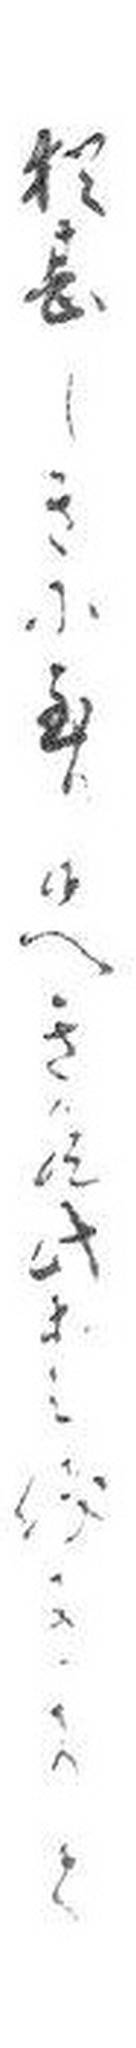猶甚しきに至り大候へき哉此等之儀によりて
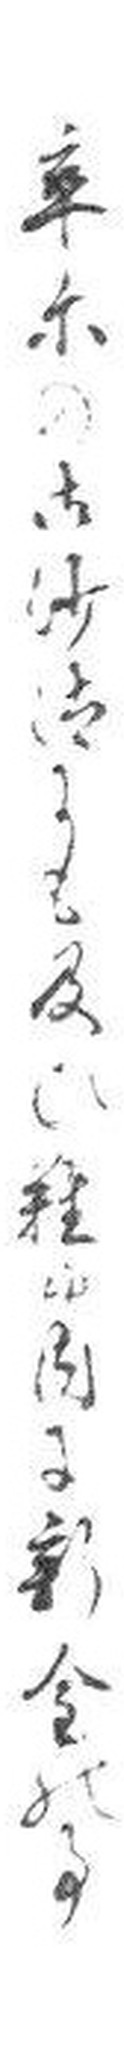卒爾の御沙汰にも及ひ難候内に新金之事
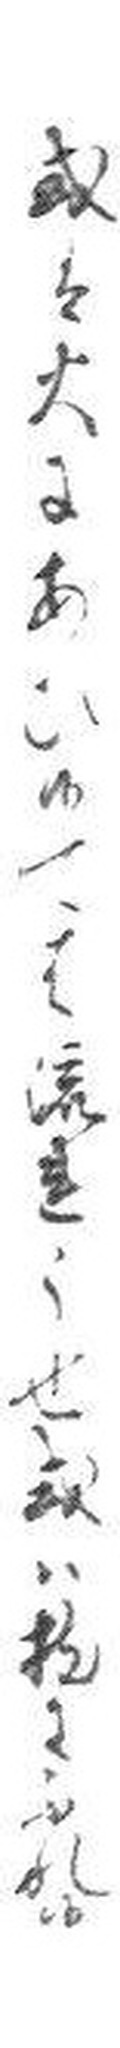或は火にあひ候ては流れうせ或ハ物にふれ候
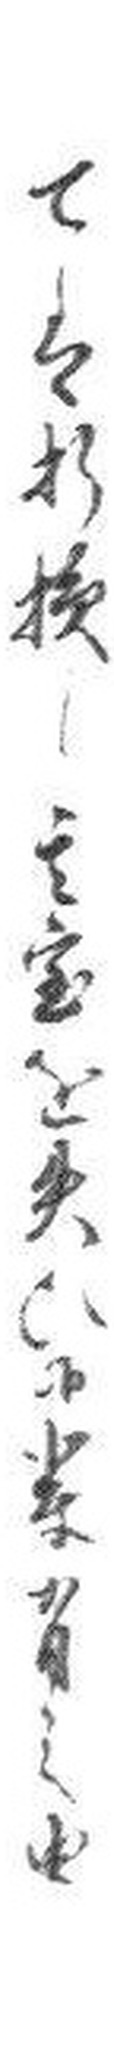ては折損し其宝を失ひ候輩有之由
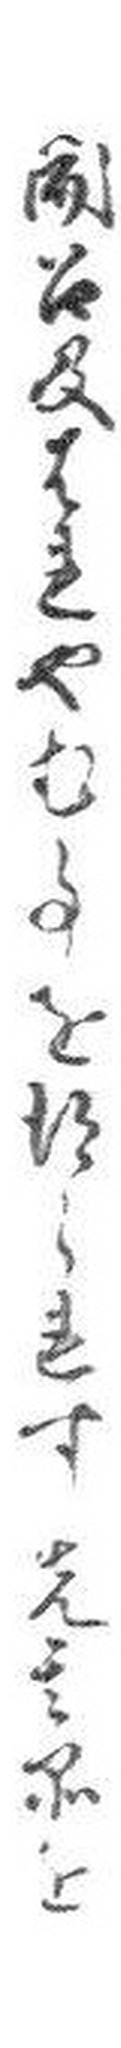聞召及はれやむ事を得られす先其品を
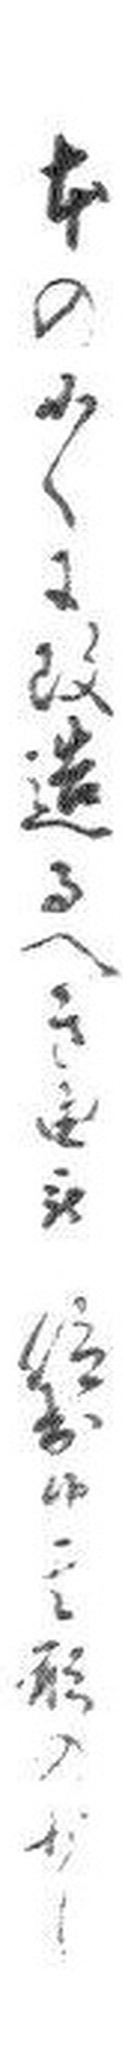本の如くに改造るへき由被仰出候其形の少し
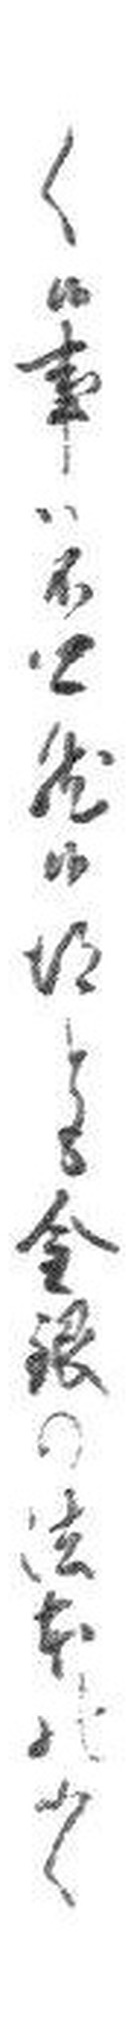く候事ハ不可然候得とも金銀の法本の如く
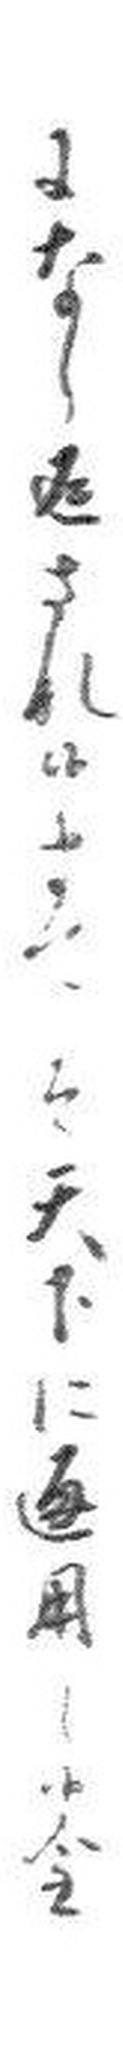になし返され候にては天下に通用し候金
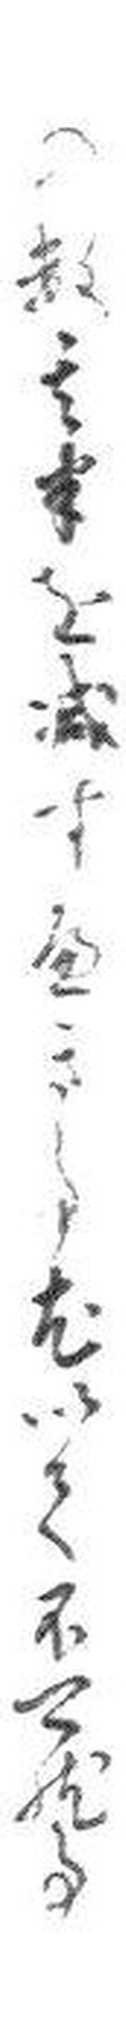の数其半を減すへき事尤以て不可然事
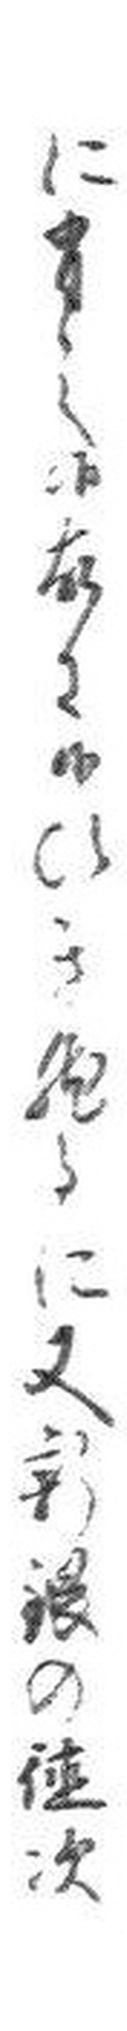に有之候故に候ひき然るに又新銀の値次
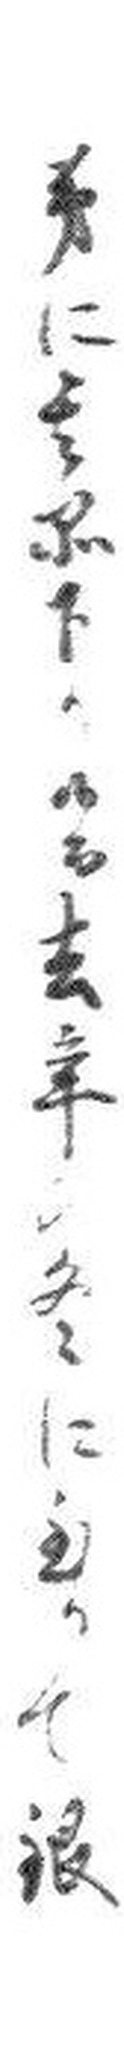第に其品下り候而去年の冬に到りて銀
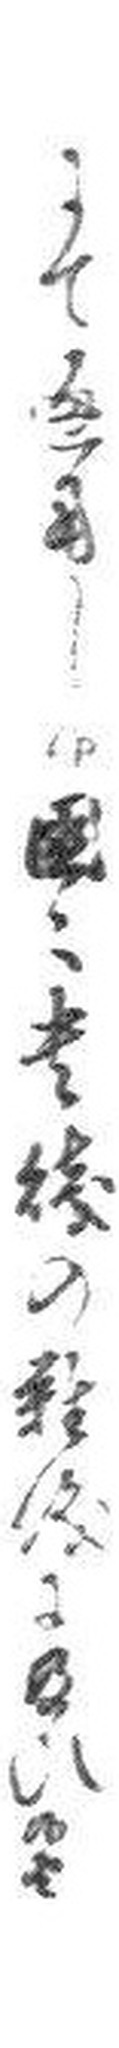に通用し候国々貴賤の難義に及ひ候由

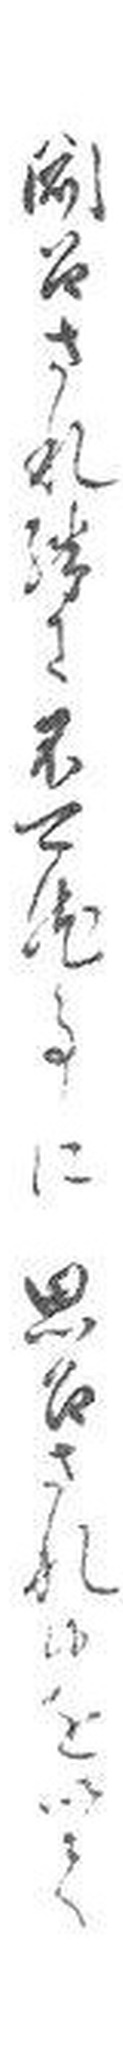聞召され殊に不可然事に思召され候を以て
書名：家譜 二十九 吉邦公 従正徳二年到正徳三年
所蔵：福井県文書館 Fukui Prefectural Archives
